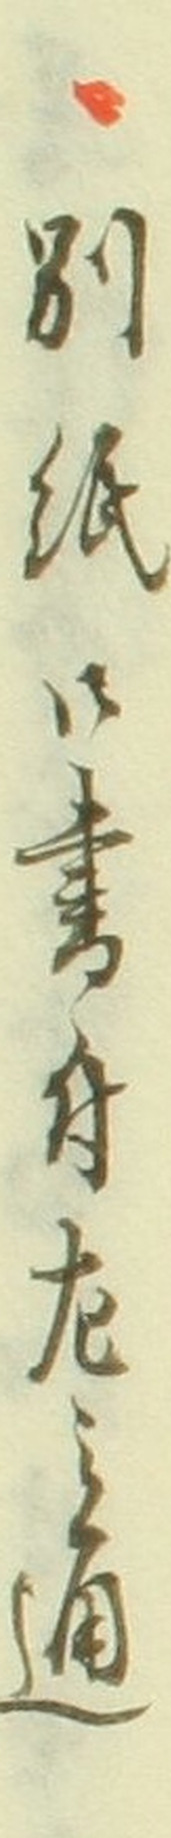別紙御書付左之通
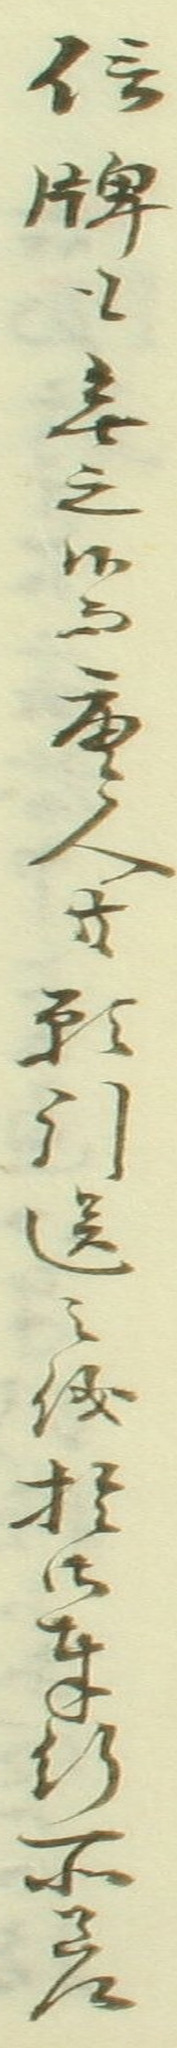信牌も無之候而唐人共願引送之儀於御奉行所差
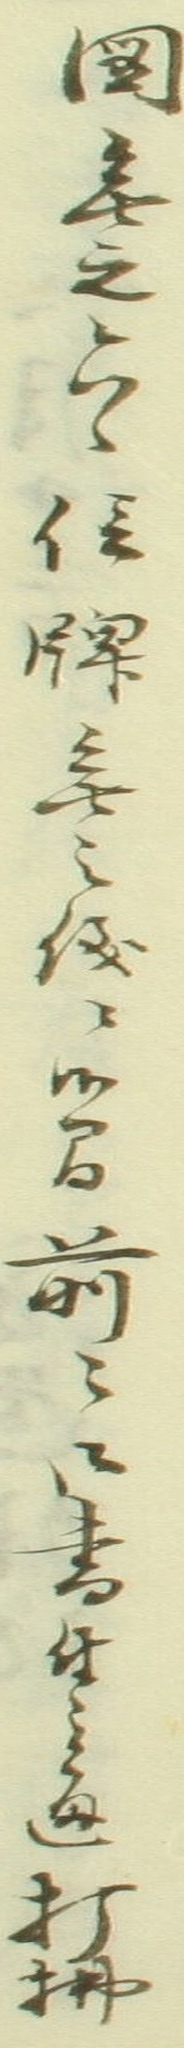図無之候はゝ信牌無之儀に候間前々御書付之通打払
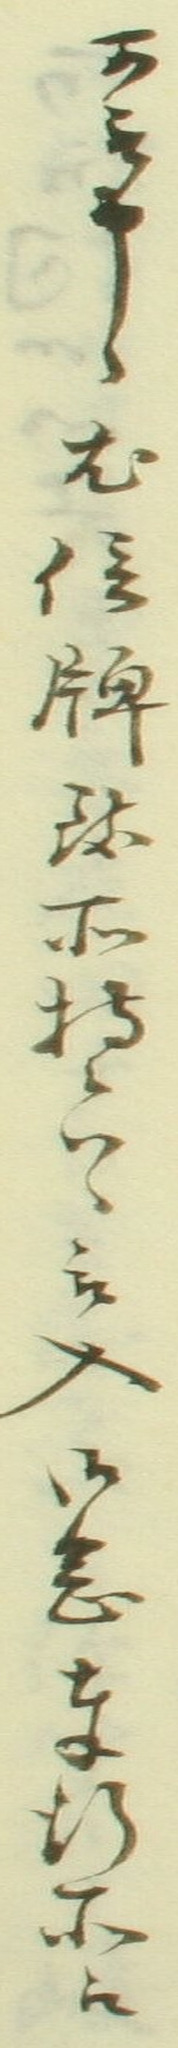可被申候尤信牌致所持候はゝ被入御念奉行所え

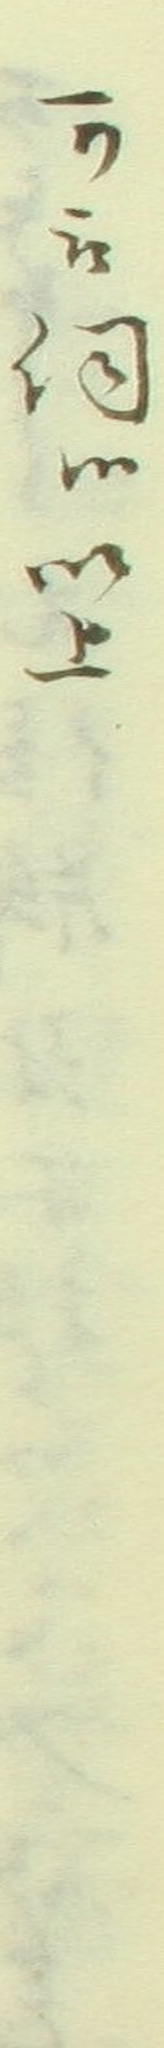可被伺候候
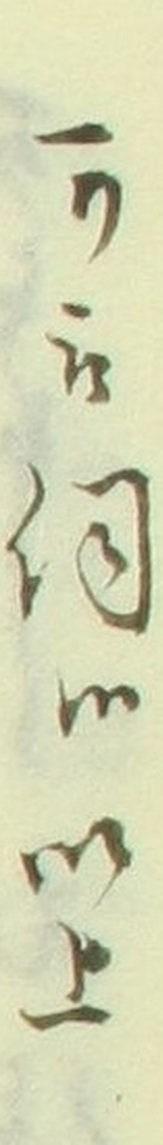可被伺候候
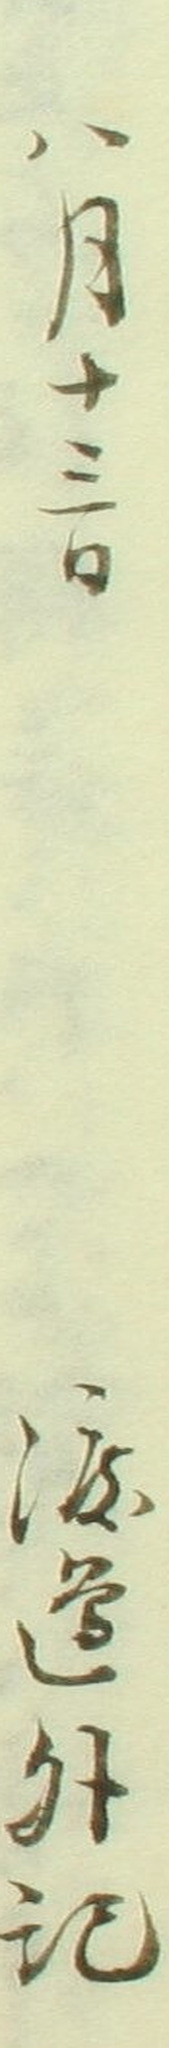八月十三日渡辺外記
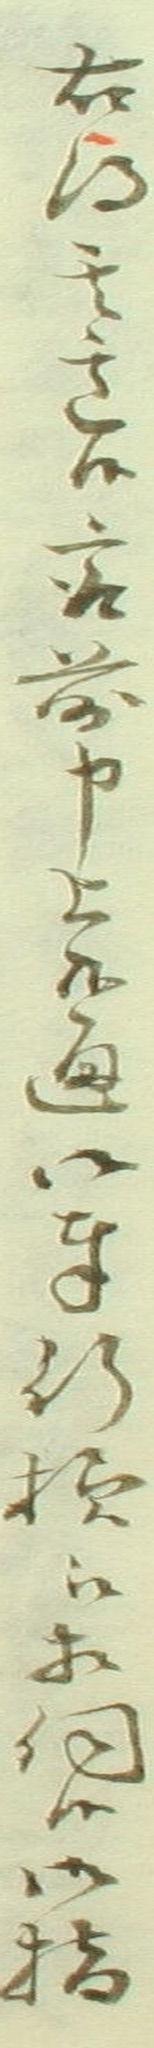右◦得其意候最前申上候通御奉行所様え相伺候御指
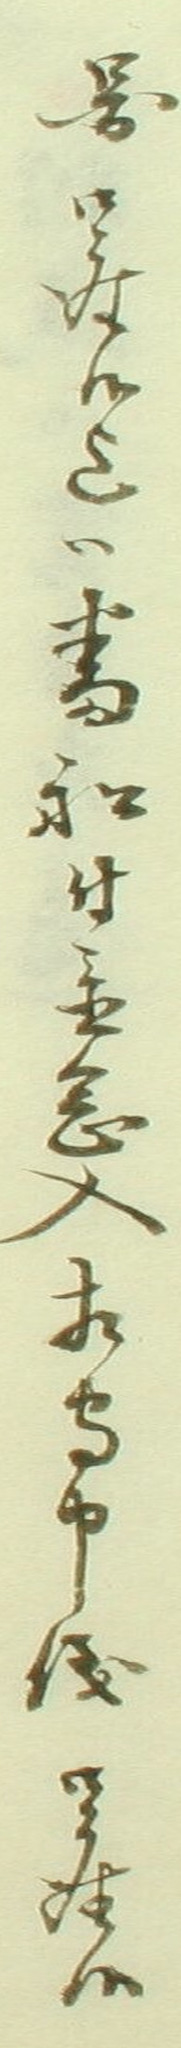図御座候迄は御番船付置念入相守申儀御座候
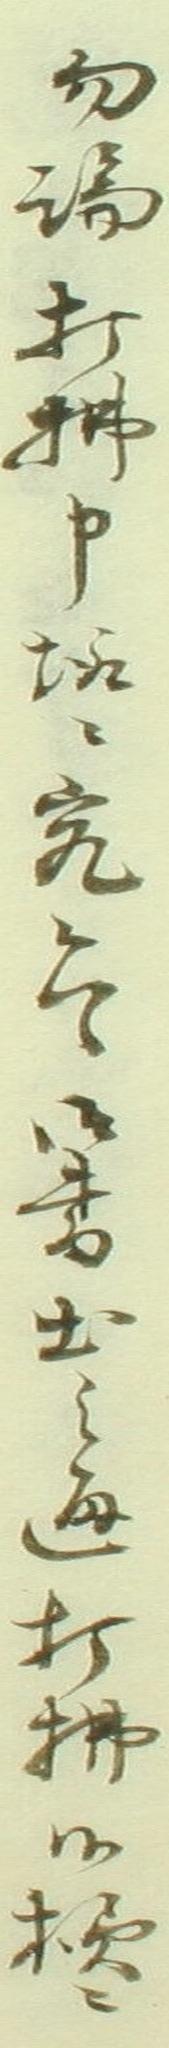勿論打払申趣に究候はゝ御書出之通打払候様に
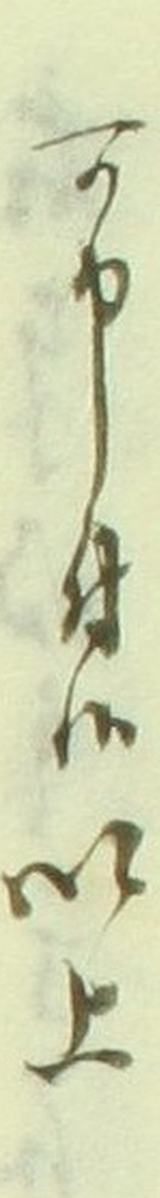可申付候以上
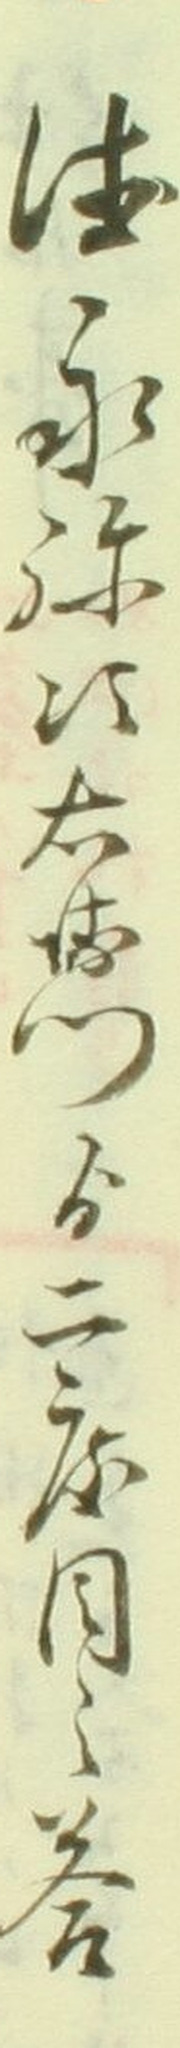徳永弥次右衛門ゟ二度目之答
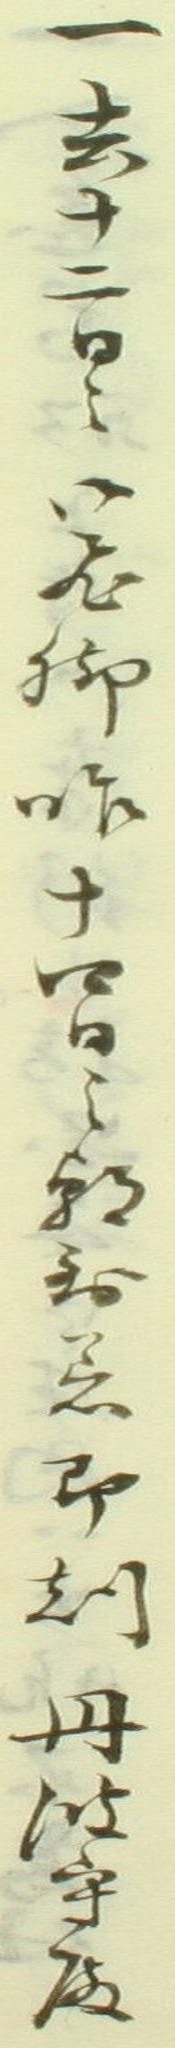一去十二日之御飛脚昨十四之朝到着即刻丹波守殿
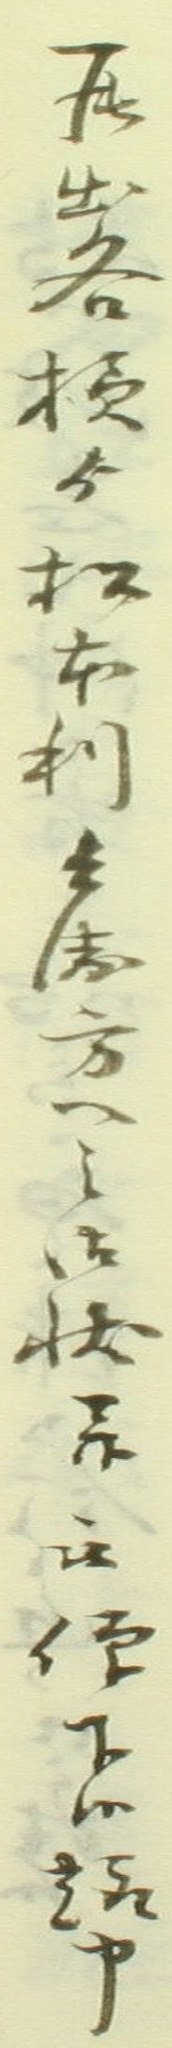罷出各様ゟ松本利兵衛方へ之御状并被仰下候趣申
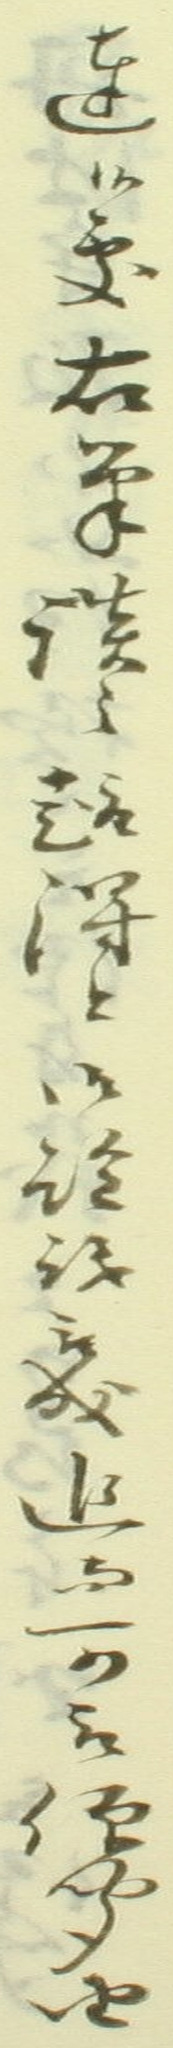達候処右筆談之趣得と御詮議被成追而可被仰聞由
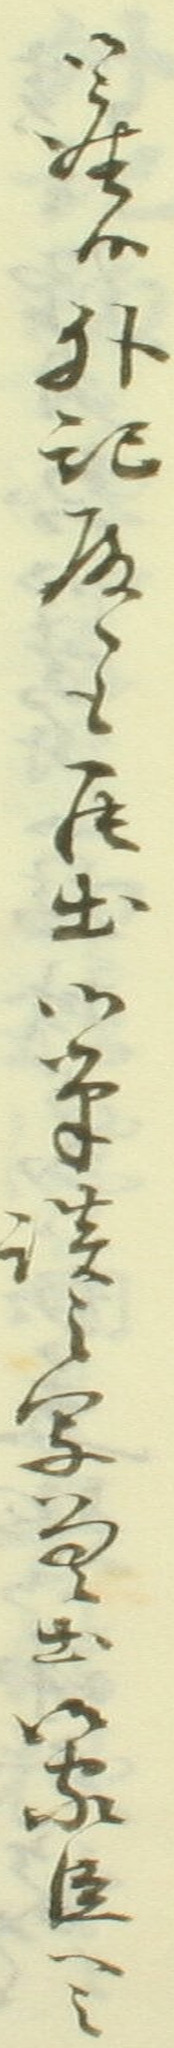御座候外記殿へも罷出御筆談之写差出御家臣へ之
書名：異国船漂着記
